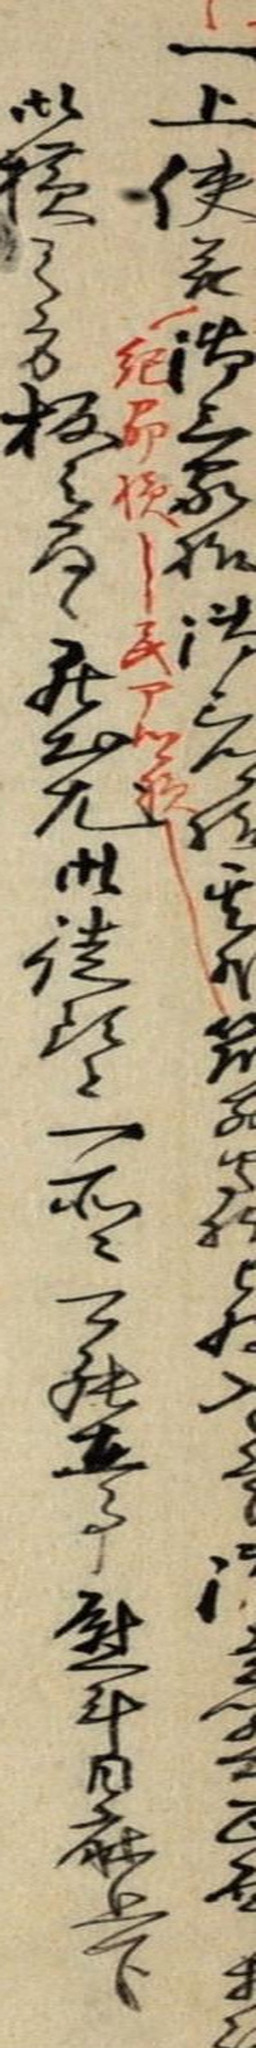御横之方板之間へ罷出尤御徒頭と一所に可罷在事熨斗目麻上下
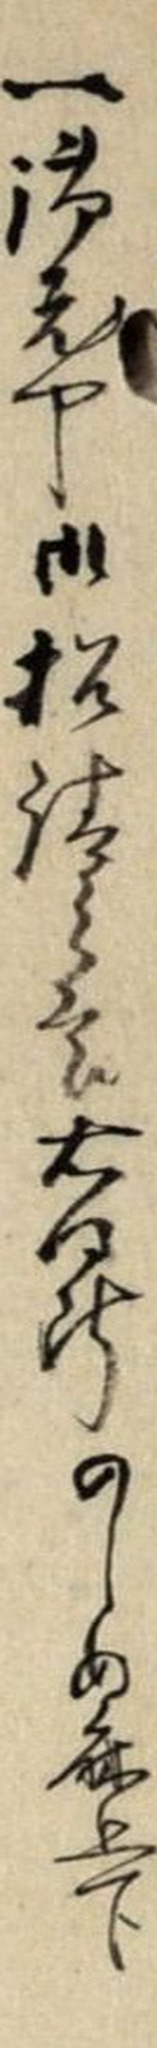一御老中御招請之節右同断のしめ麻上下
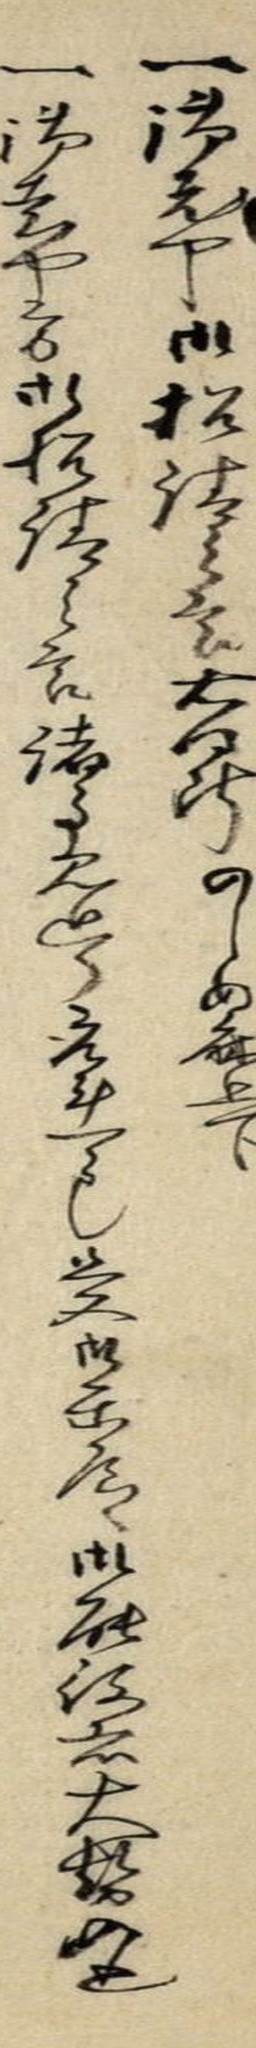一御老中方御招請之節諸事見廻り取計可申候且又御楽屋へ御能役者大勢入込
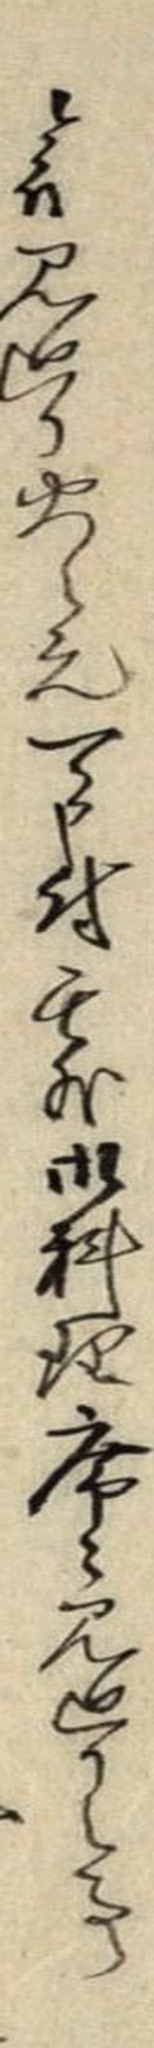候に付見廻り火之元可申付其外御料理席々見廻り之事
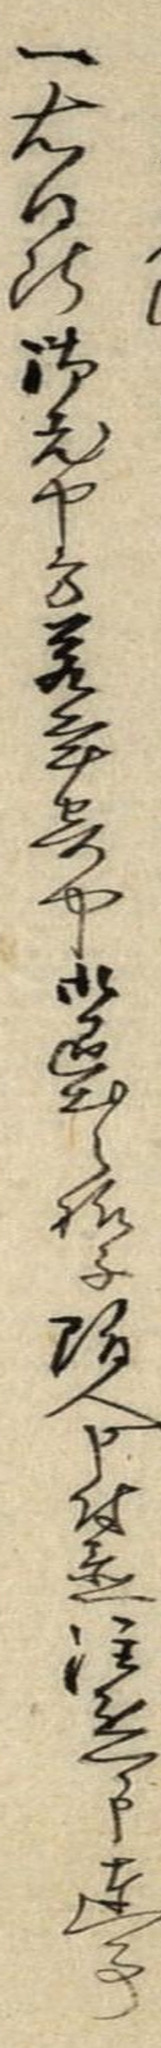一右同断御老中方若年寄中御退出之様子附人申付置注進可申達事
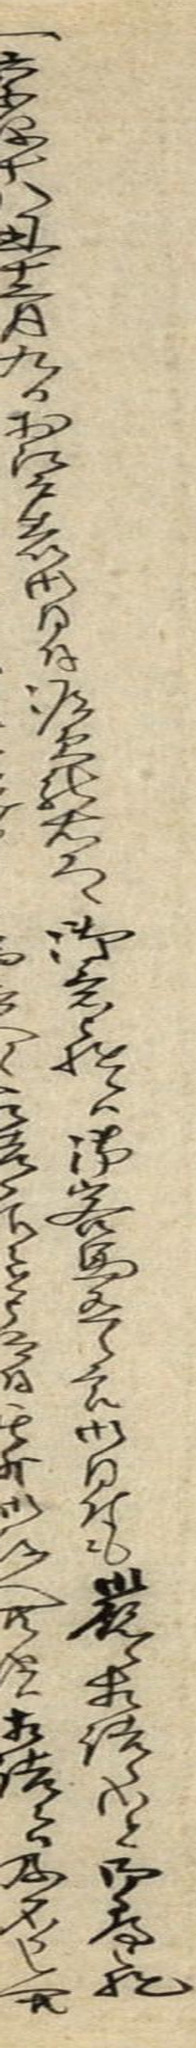一享保十八丑十二月九日於江戸表御目付渥美新右衛門へ御意被遊候は御客馬有之節御目付も御厩へ相詰候哉と御尋被遊
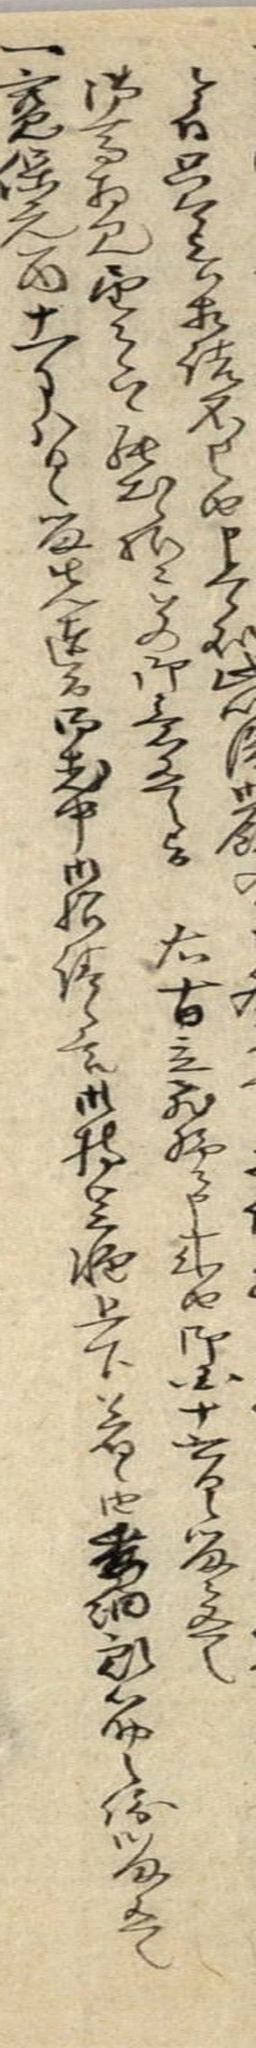一寛保元酉十一月八日之留先達て御老中御招請之節御持足軽上下着候由委細願筋之儀留有之

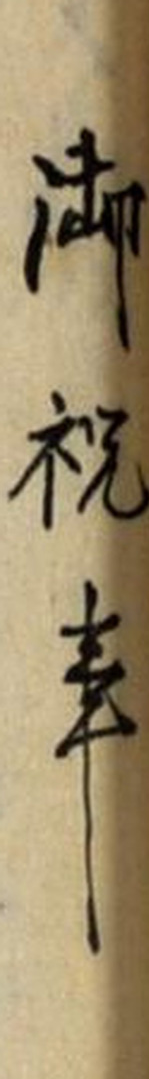御祝事
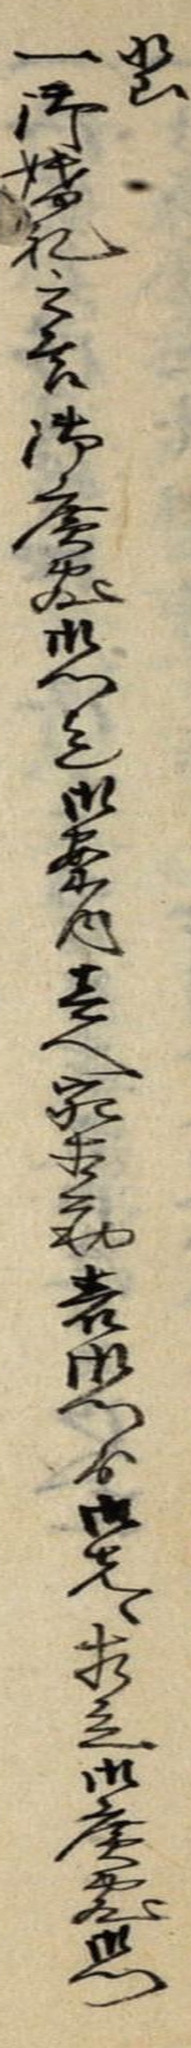一御婚礼之節御広敷御門迄御案内壱人宛相勤表御門ゟ御先へ相立御広敷御門
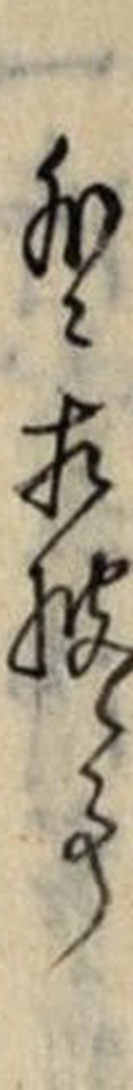外に相披候事
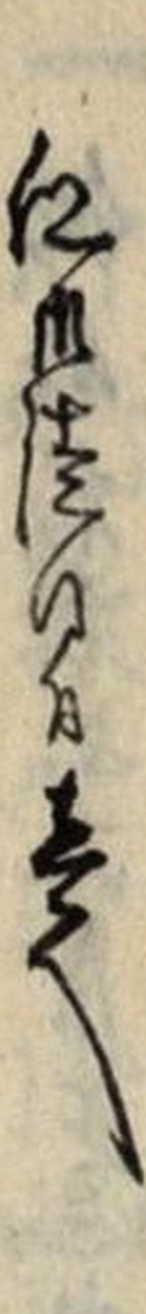但御徒目付壱人
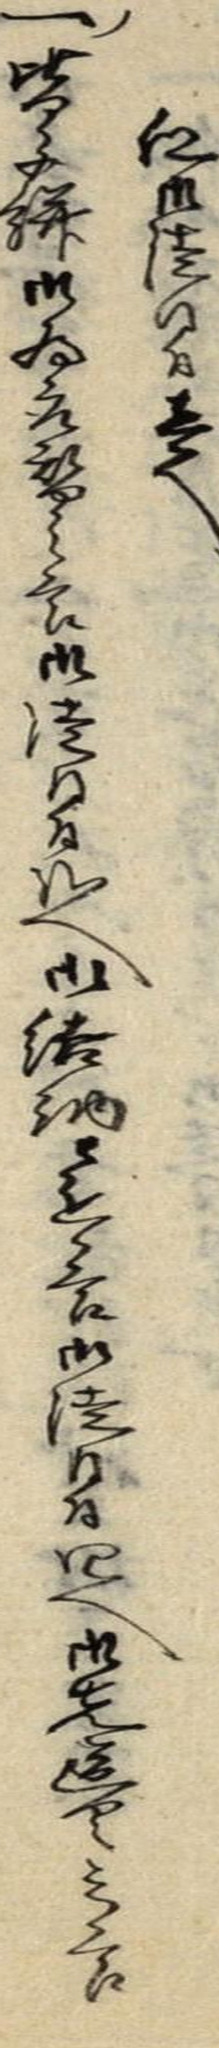一皆子餅御為取替之節御徒目付弐人御結納に進候節御徒目付四人御先道具之節
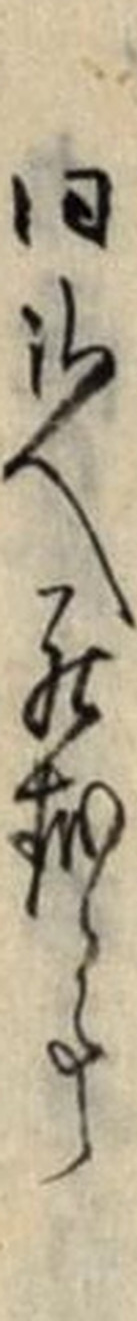同弐人罷越候事
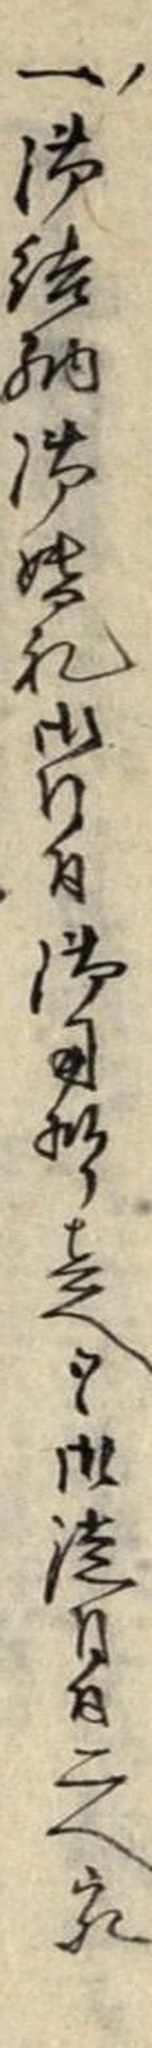一御結納御婚礼御目付御用掛り壱人ツヽ御目付二人宛
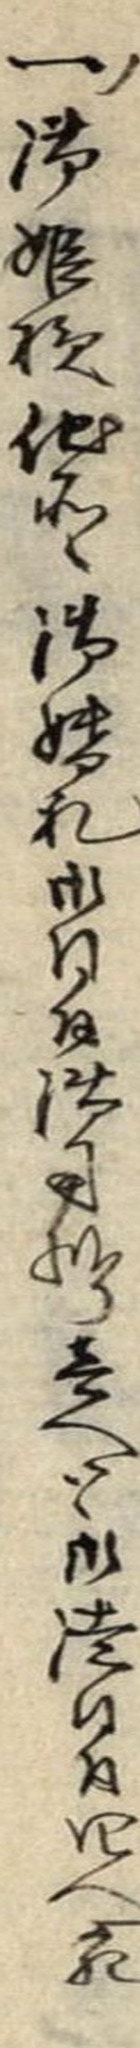一御姫様他所へ御婚礼御目付御用掛り壱人ツヽ御徒目付四人宛
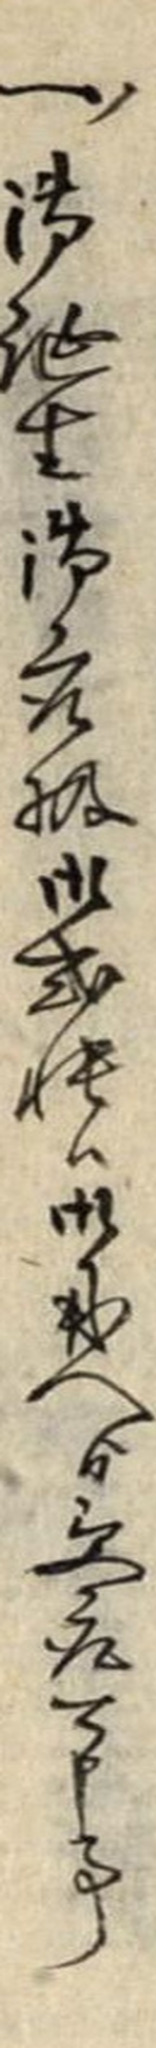一御誕生御取扱御式帳は御用人ゟ受取可申事
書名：三都并道中之部
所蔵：福井県文書館 Fukui Prefectural Archives
